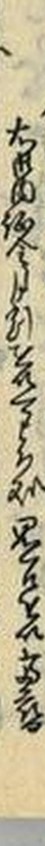右御内証金月割を以可被下処思召を以当暮
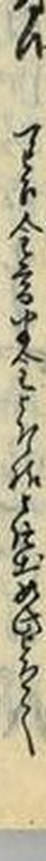可被下金高半金被下候様被仰出如此被下之
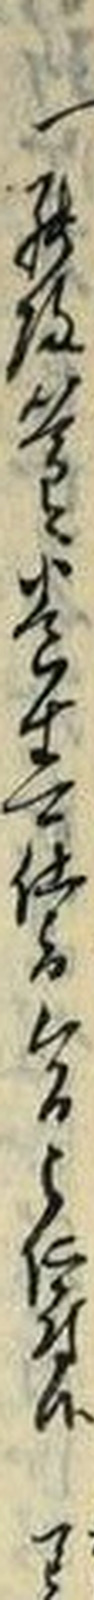罷帰篤と養生可仕旨今日被仰付候
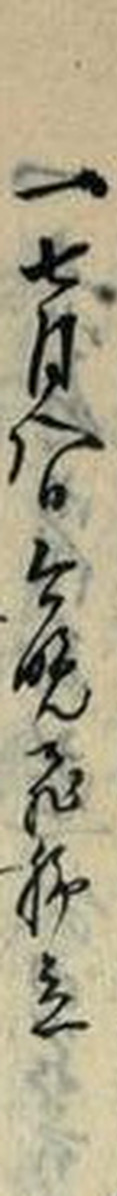一七月八日今晩飛脚立
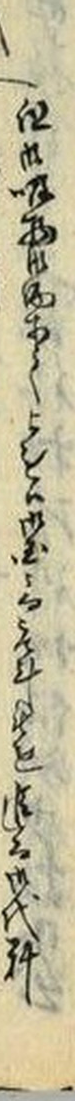但御吸物御酒等之被進ハ御国ニ而取斗被進追而御代料
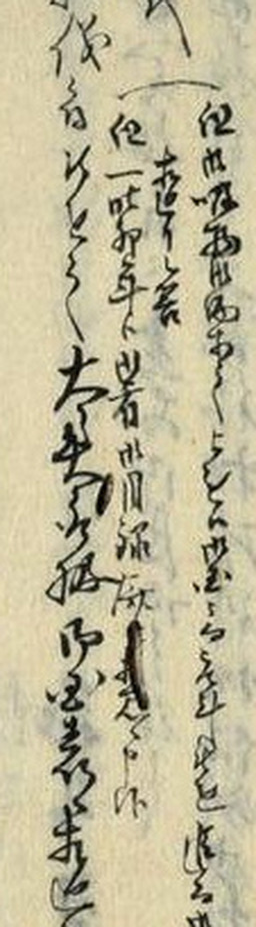但一昨卯年ハ御肴御目録済申候
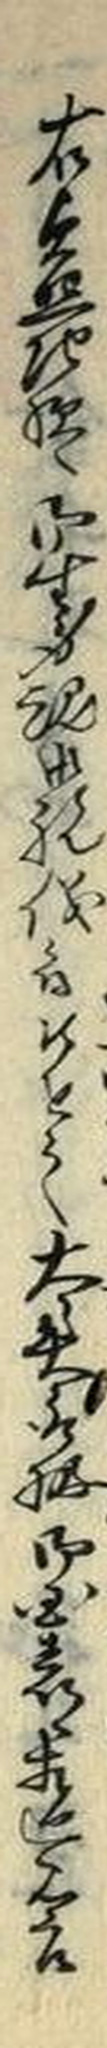右貞照院様へ御生身魂御祝儀ニ付被進之大奥取扱御国表へ相廻候筈
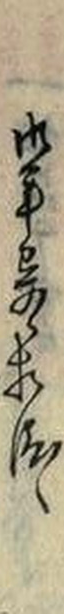御年寄へ相渡候
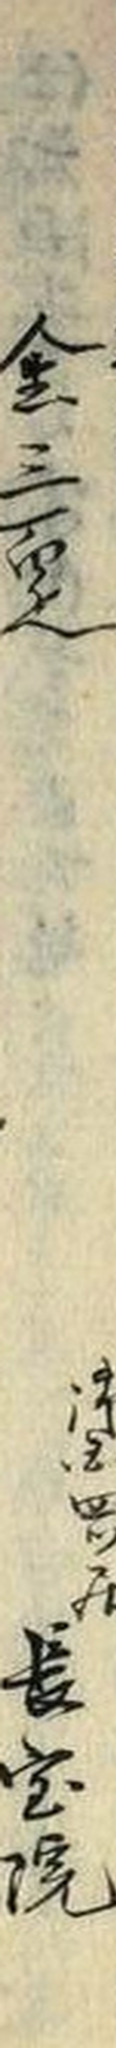金三百疋御国四ツ居長宝院
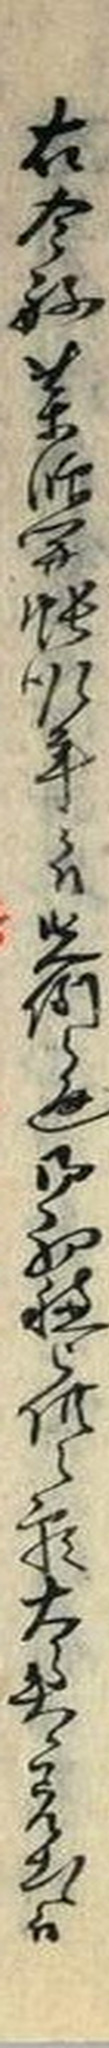右今般薬師開帳順年ニ付先例之通御初穂被供之願大奥へ差出候ニ付
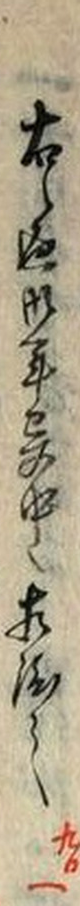右之通御年寄中へ相渡之
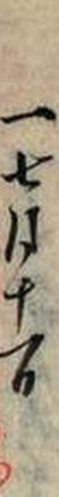一七月十一日
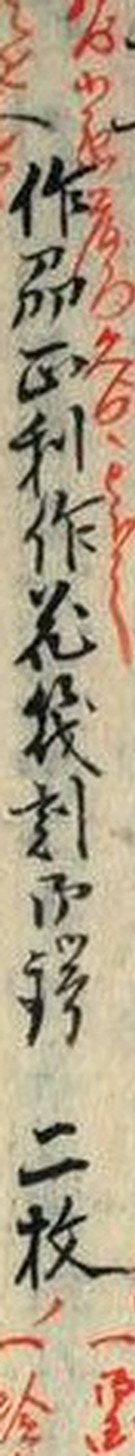作州正利作花筏刻御鍔二枚
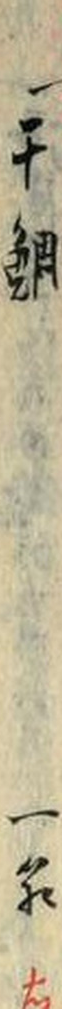干鯛一箱
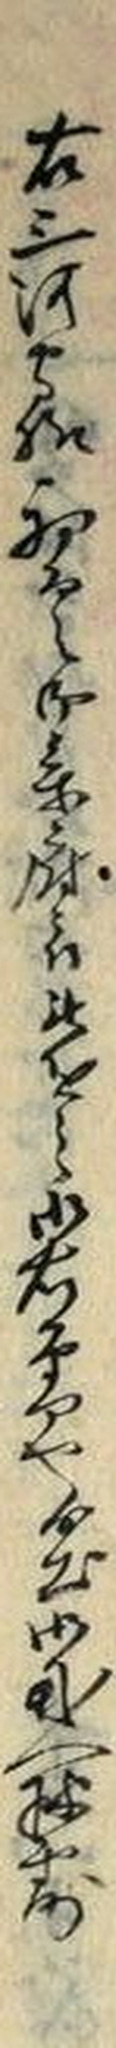右三河守様初而之御参府ニ付被進之御右筆部やゟ出御用人披露

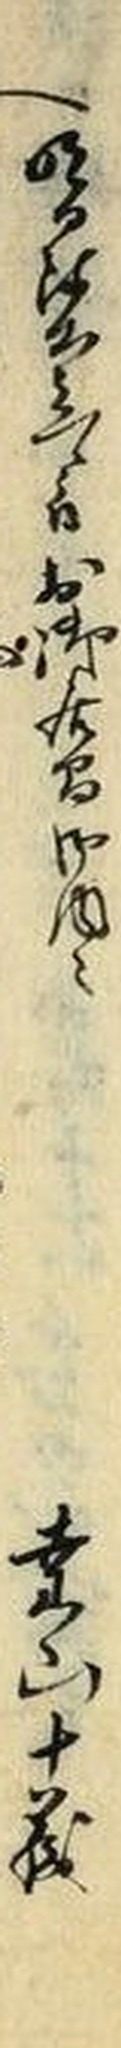明日致出立候ニ付於御居間御内々桑山十蔵
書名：少傅日録抄（斉承付側向頭取日記、在府）
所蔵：福井県文書館 Fukui Prefectural Archives
